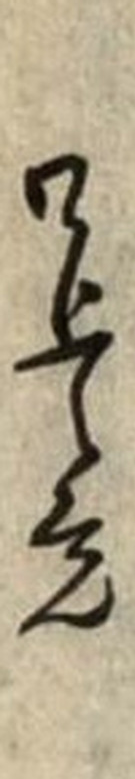口上之覚
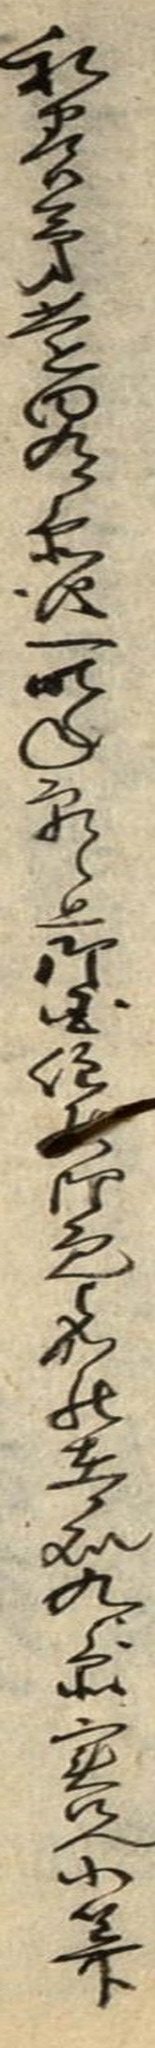私養弟遠田九郎兵衛儀一昨年願之上御国住御免被成罷在処九郎兵衛実兄小算
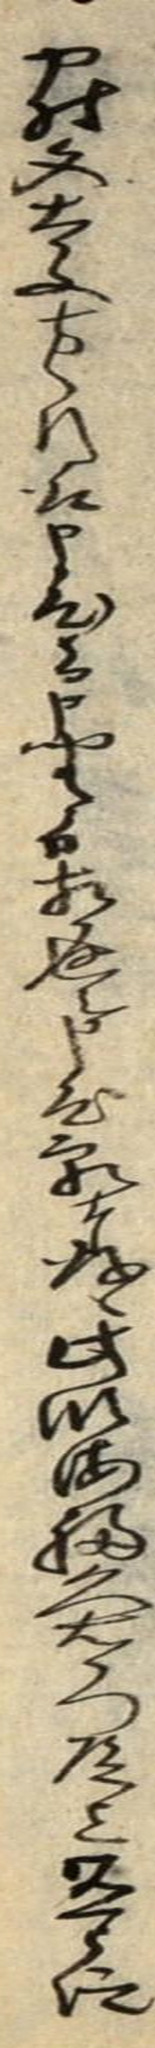中村文太夫方へ引取申度旨申聞候ニ付相返し申度願奉存候此段海福久右衛門殿迄宜被仰

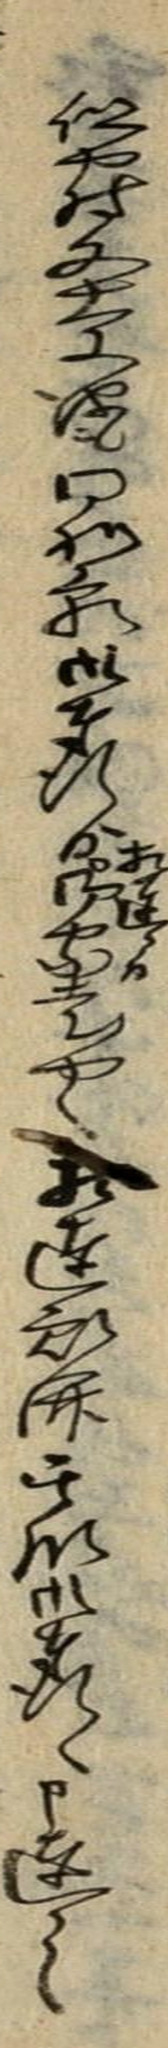但中村文大夫儀も同様願御奉行ゟ相達候ニ付御家老中へ相達願済其段奉行へ申達之
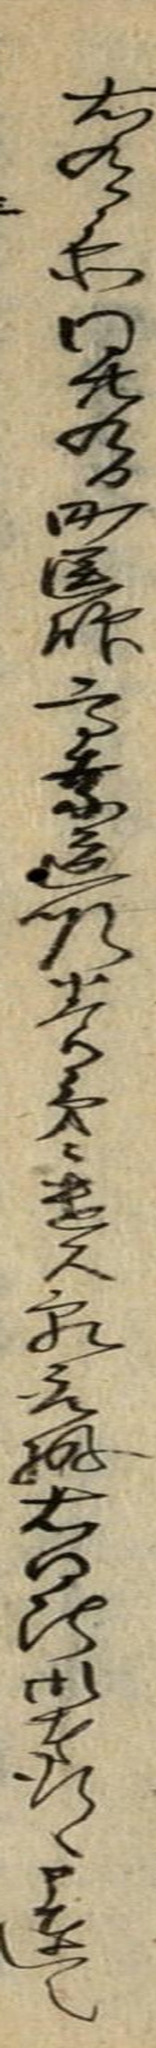右九郎兵衛同廿九日町医師高桑道順養弟ニ遣ス願取扱右同断御奉行へ申達之
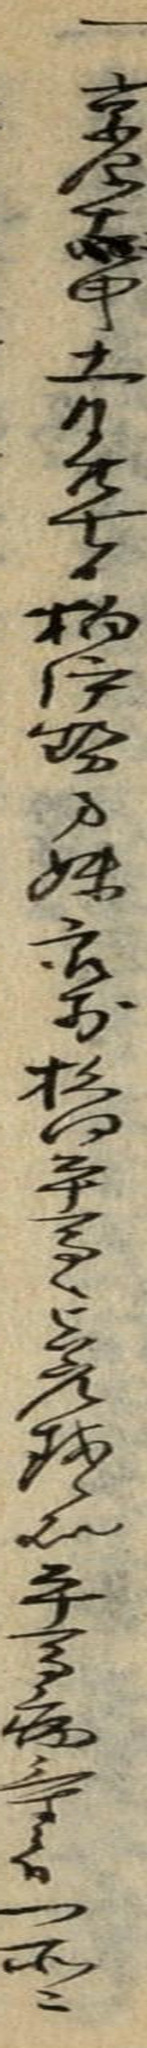一享保十三申十一月廿七日狛伊勢方妹最前杉田平馬へ被差越候処平馬病気ニ付一所ニ
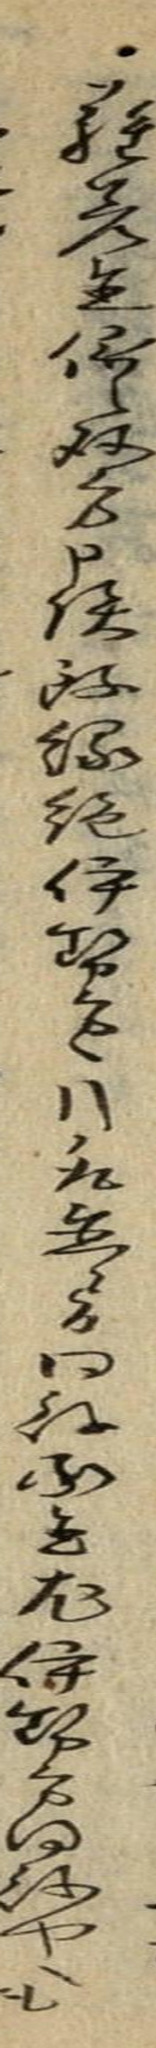難差置依之双方申談致縁絶伊勢方へ引取置候旨同役承置尤伊勢方同役中へも
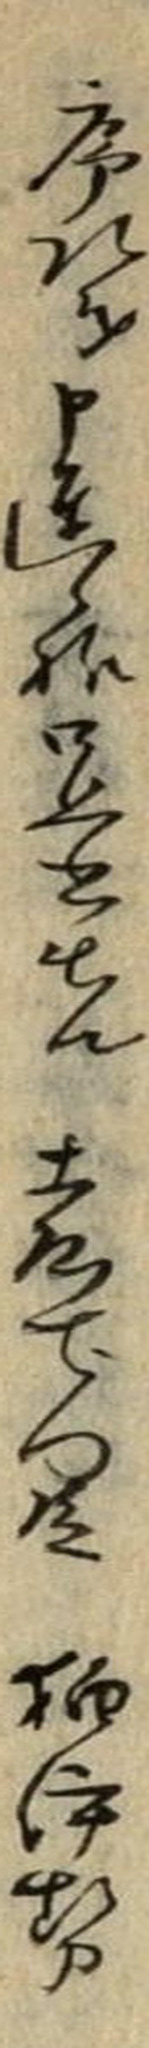序次第申達候様口上書出候土屋十郎右衛門殿狛伊勢
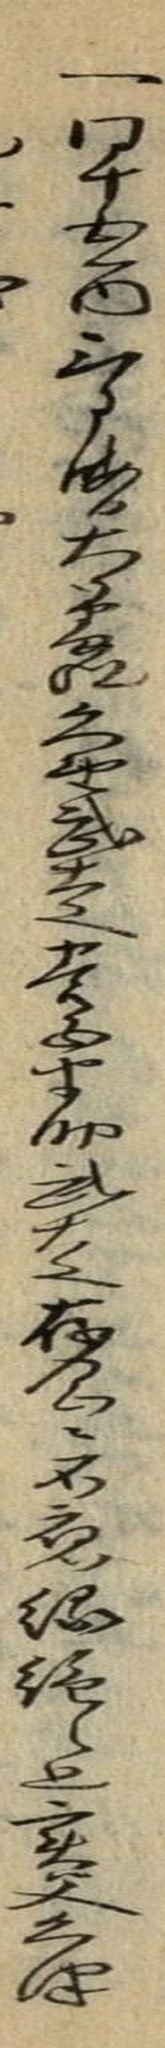一同十五酉三月晦日大御番組久野武大夫養子半助武大夫存念ニ不応縁絶之上実父久津
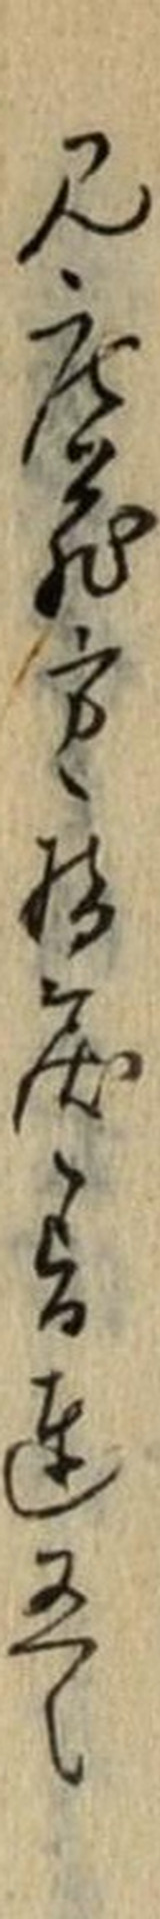見庄蔵方へ指戻候旨達有之
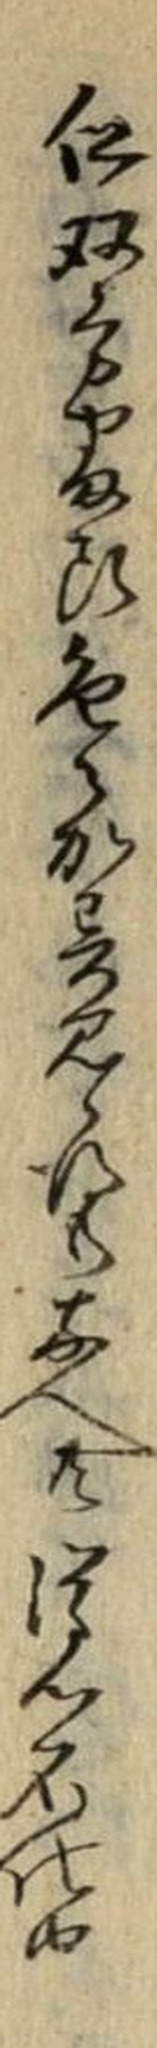但双方番頭色々加異見候得共両人共得心不仕由
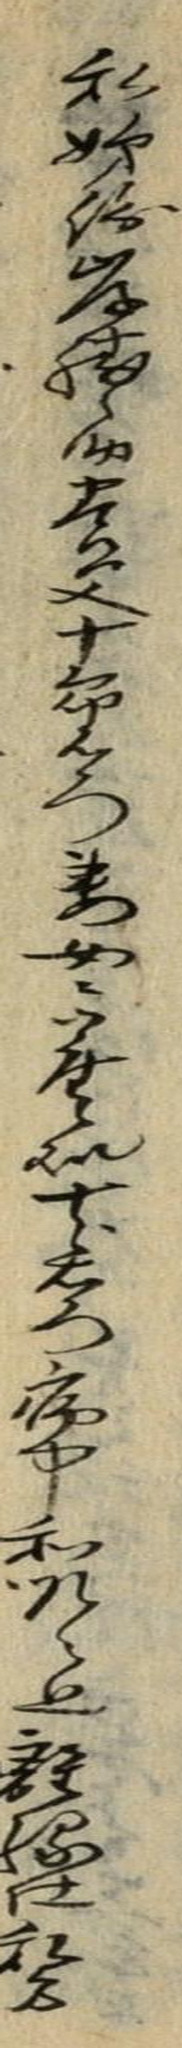私姉儀岸勝之助養父十郎右衛門妻女ニ御座候処十郎右衛門病中和順之上離縁仕私方
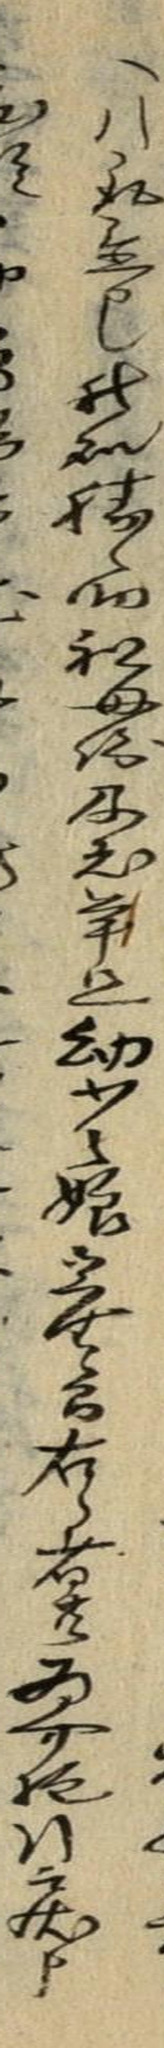へ引取置申候然処勝之助祖母儀及老年且幼少之娘御座候間右之者共為介抱引戻申
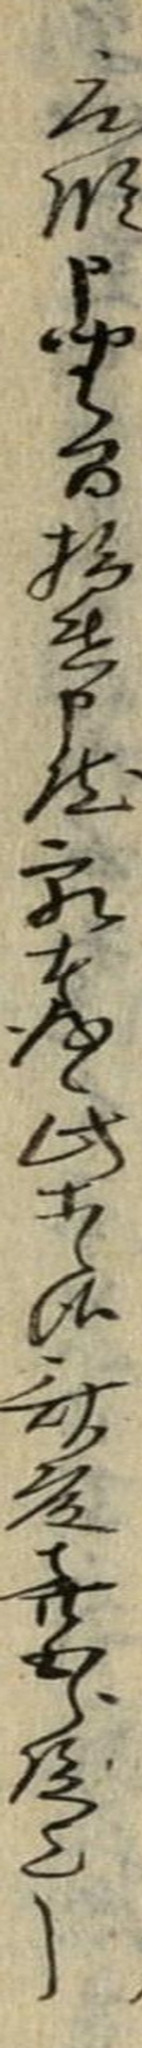度段申聞候間指遣申度願奉存候此等之趣斎藤喜五郎殿迄ー
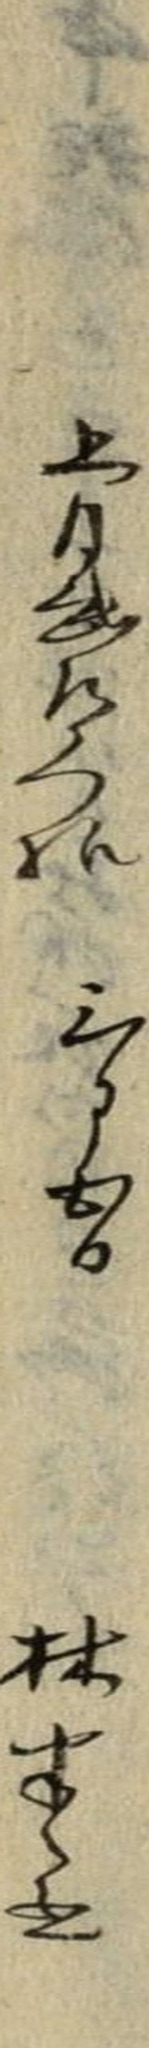上月武左衛門様三月五日林半之丞
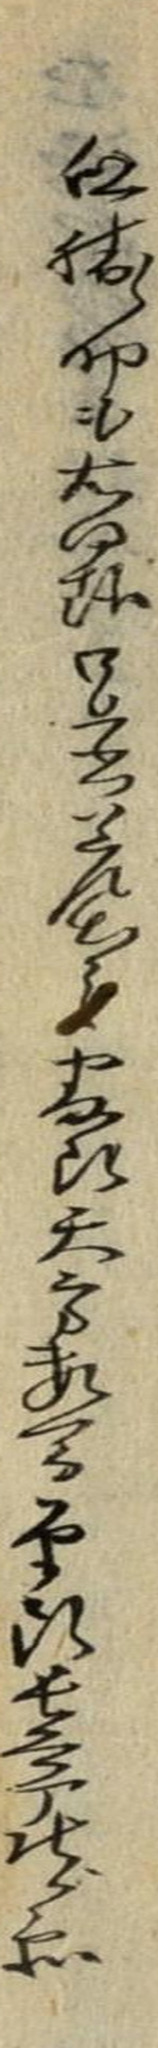但勝之助も右同趣口上書差出之番頭天方数馬筆頭長谷部次郎兵衛
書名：養子縁組之部
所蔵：福井県文書館 Fukui Prefectural Archives
